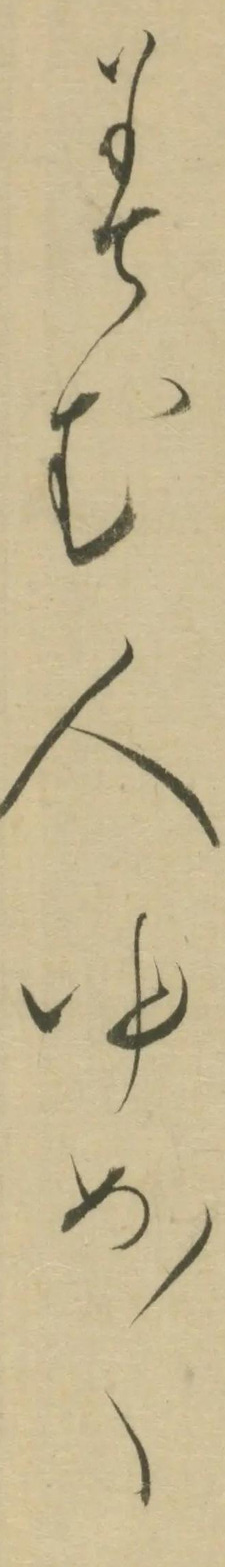見む人ゆめ〳〵
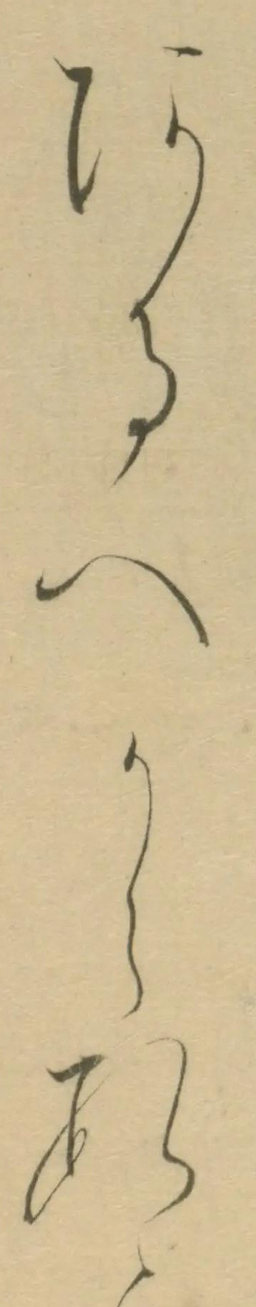あるへからすと

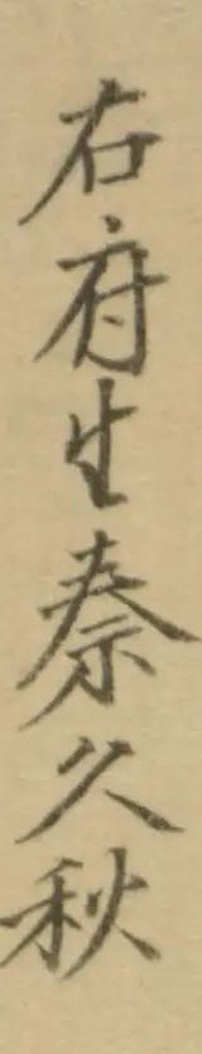右府生秦久秋
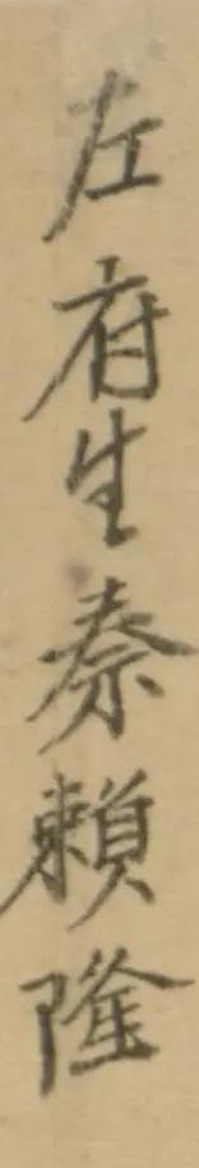左府生秦頼隆
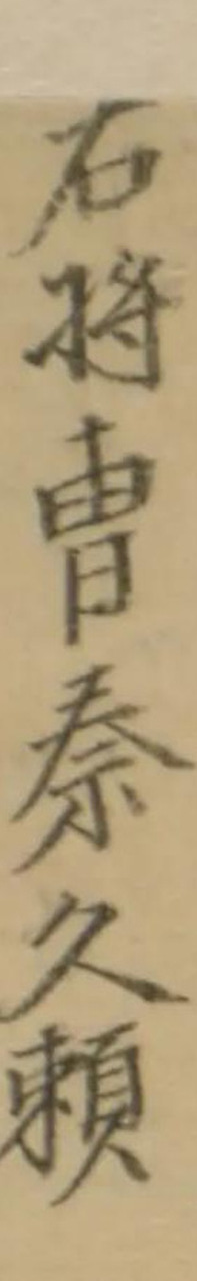右将曹秦久頼

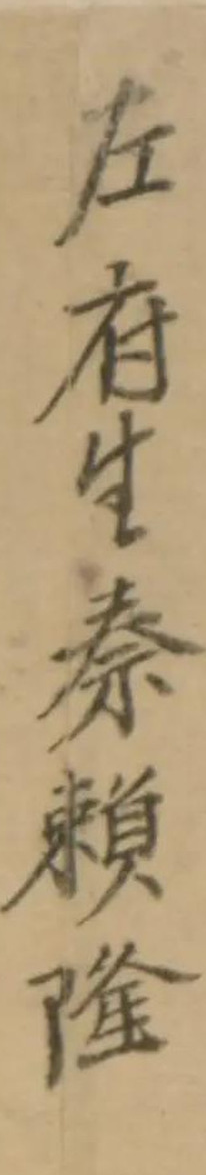左府生秦頼隆
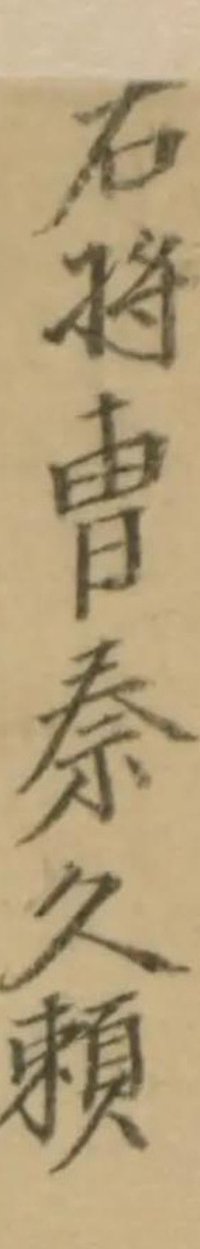右将曹秦久頼

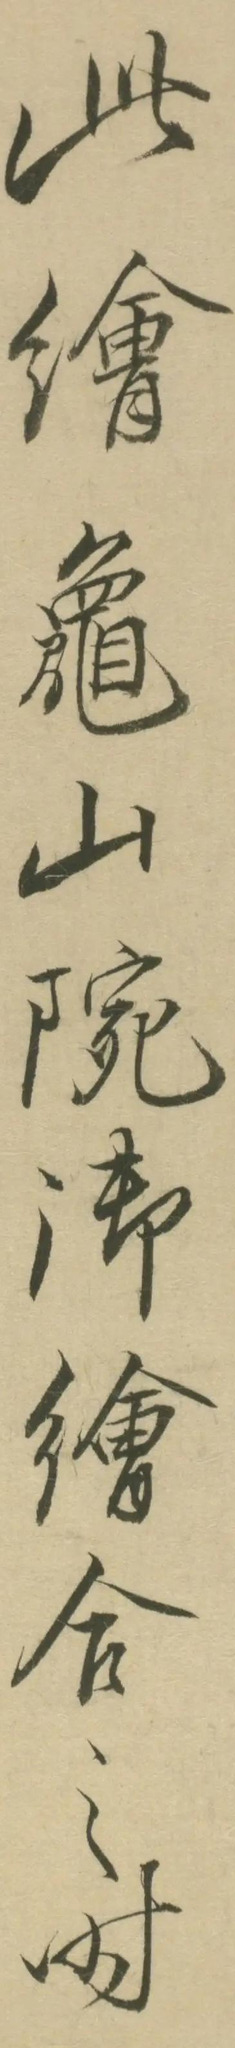此絵亀山院御絵合之時
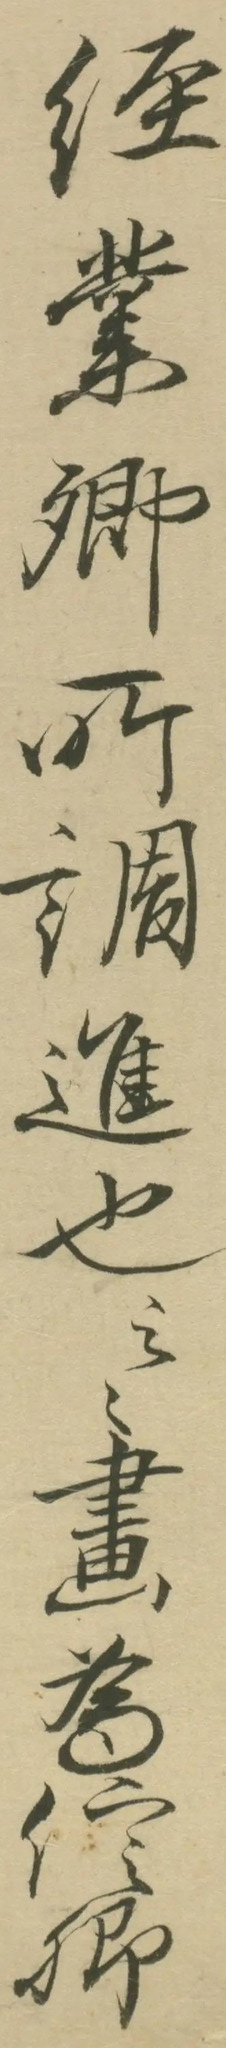経業卿所調進也云々画為信卿
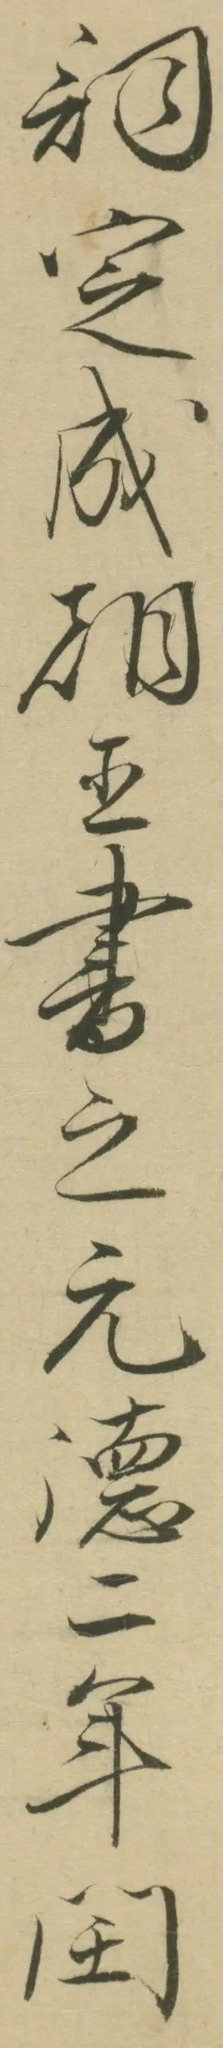詞定成朝臣書之元徳二年閏
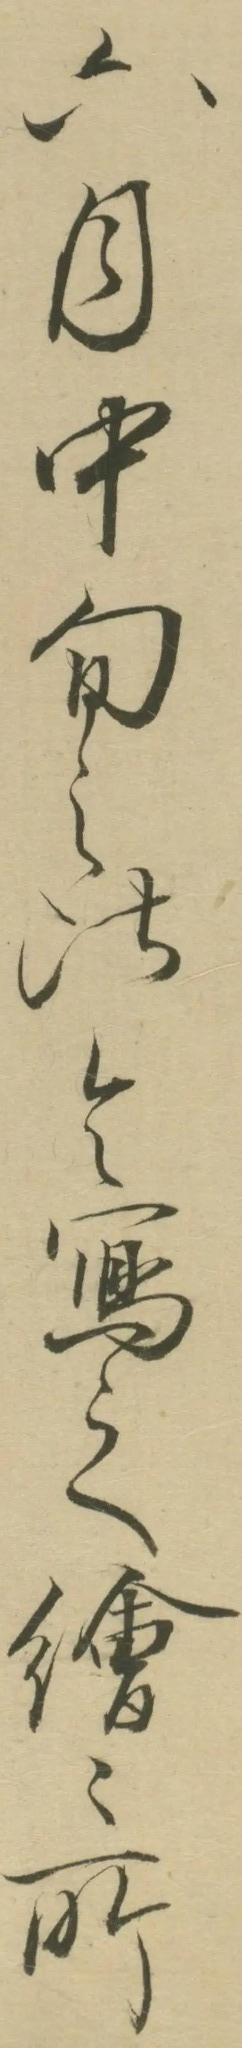六月中旬之比令写之絵々所
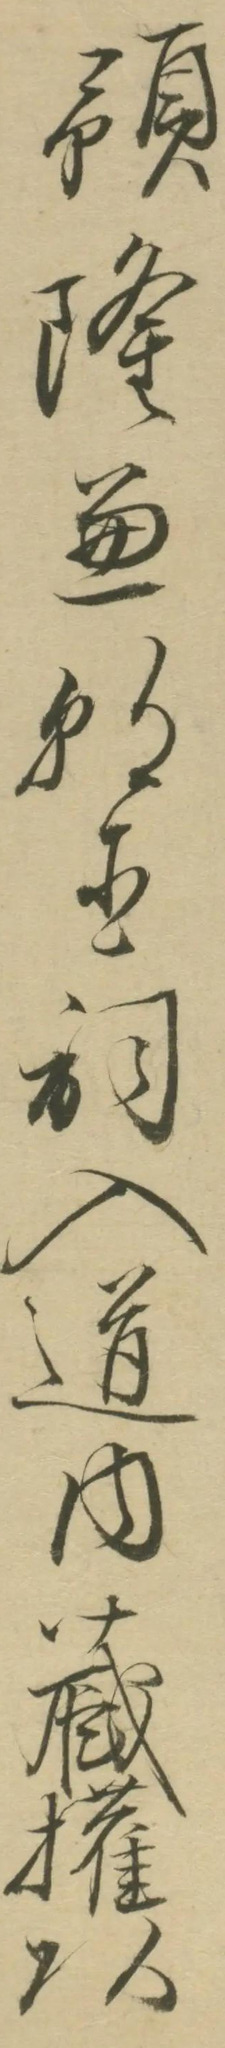預隆兼朝臣詞入道内蔵権頭

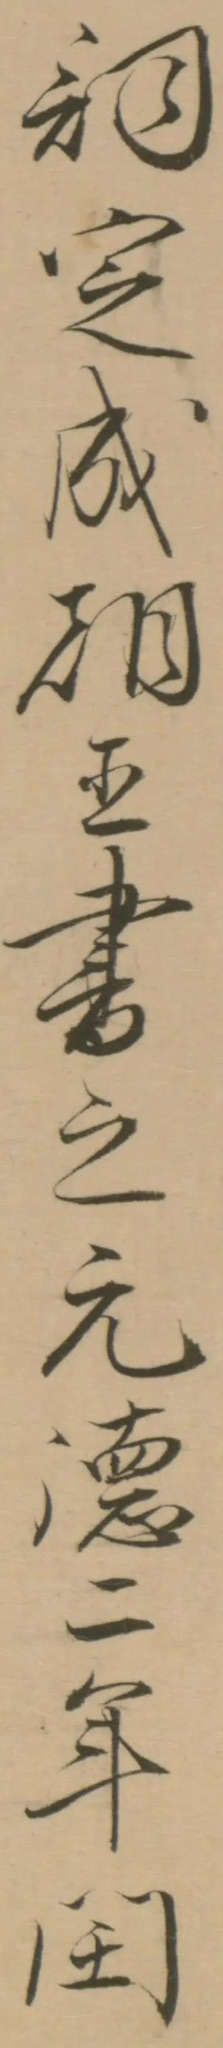詞定成朝臣書之元徳二年閏
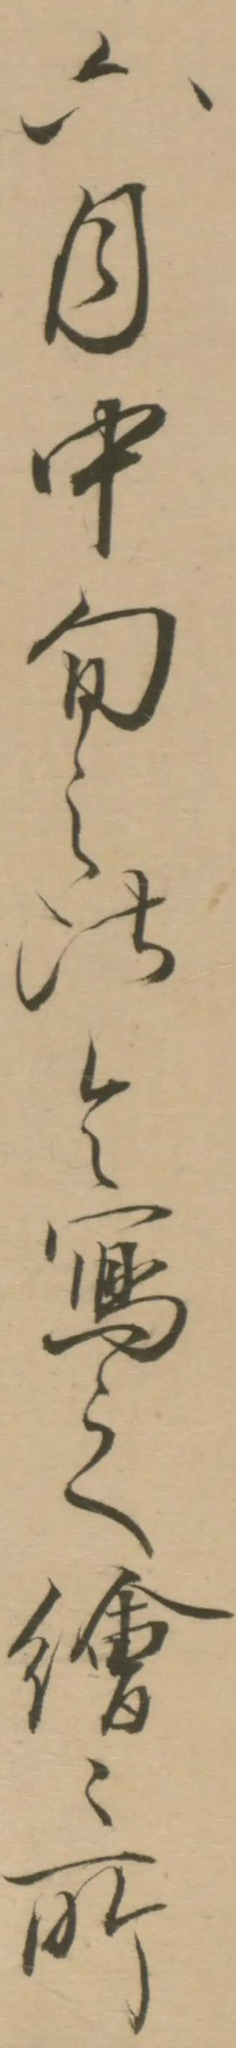六月中旬之比令写之絵々所
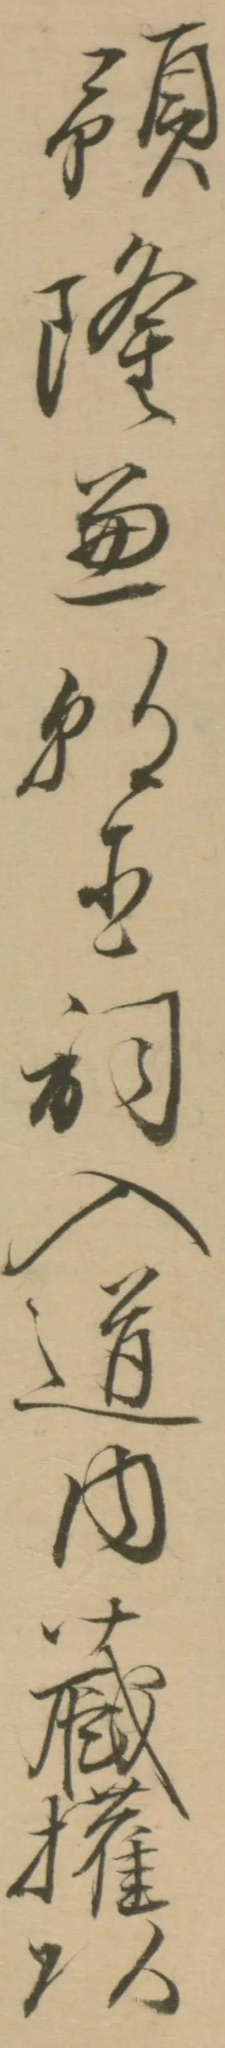預隆兼朝臣詞入道内蔵権頭
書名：文永賀茂祭図. [2]
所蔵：国立国会図書館 National Diet Library, JAPAN
